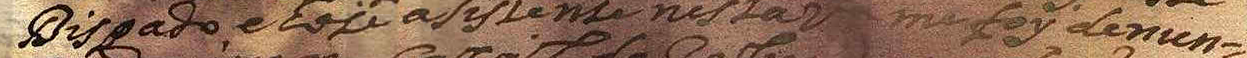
Bispado, e hoje asistente nesta Va me foy denun
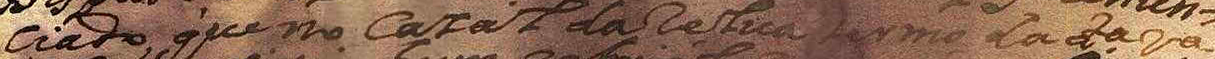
ciado, que no cazal da Relua termo da d̄a va
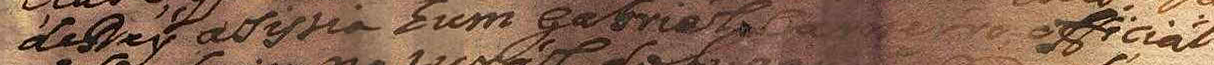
de Rey asistia hum gabriel Carneiro official
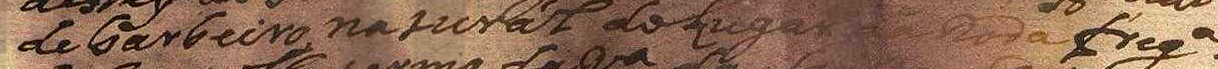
de barbeiro natural do Lugar da Roda frega.
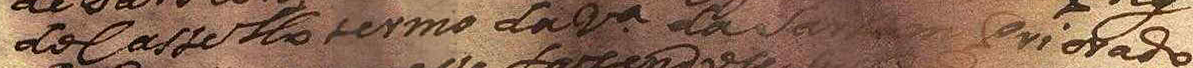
do Castello termo da V.a da sar_m Priorado
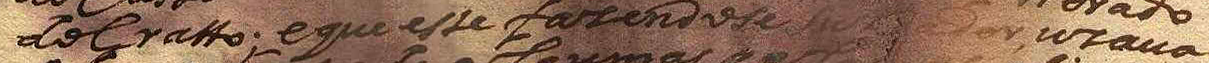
do Cratto; e que este fazendose ____ dor, uzaua
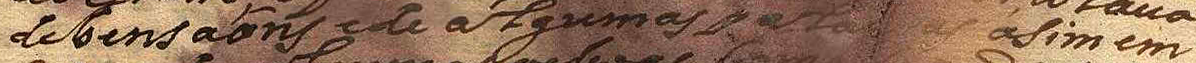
de bensaõns e de algumas palavras asim em
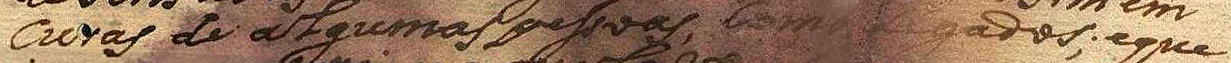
curas de algumas pessoas, como _ gados; e que
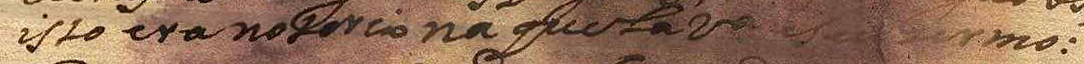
isto era notorio naqueLa va e seu termo:
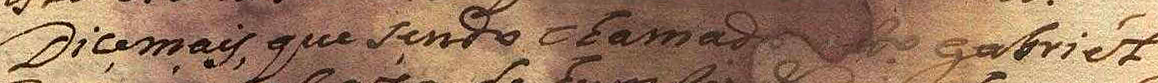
Dice mais, que sendo chamado d̄.o gabriel
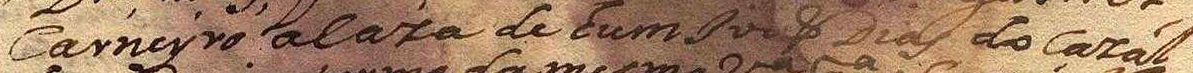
Carneyro a caza de hum Ioaõ Dias do cazal
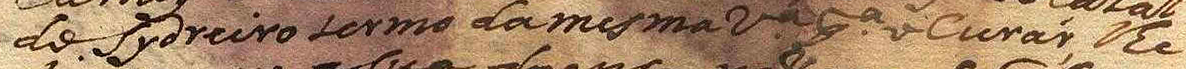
do sydreiro termo da mesma V.a p.a o curar, lhe
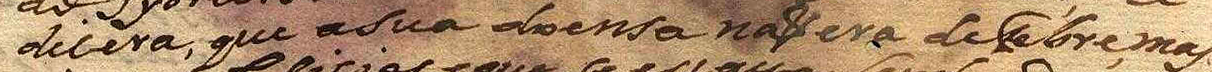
dicera, que a sua doensa naõ era de Febre, mas
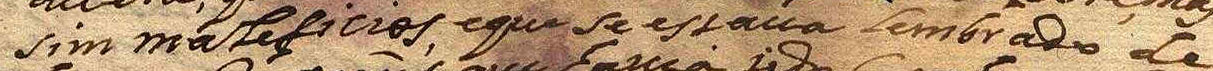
sim maleficios, e que se estaua lembrado de
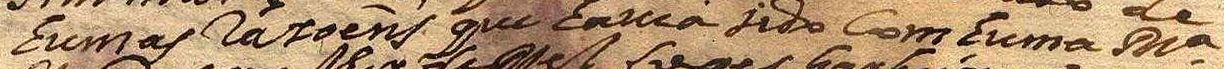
humas Razoen̄s que hauia tido com huma M.a
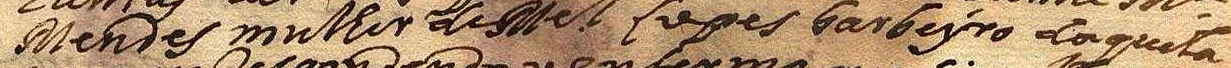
Mendes mulher de Mel Lopes barbeyro daquela
